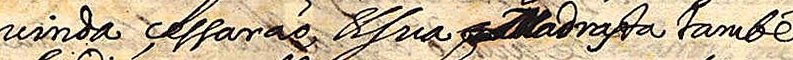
uinda çessaraõ, & sua pMadrasta tambē
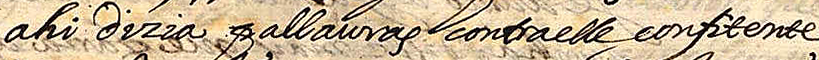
ahi dizia pallauras contra elle confitente
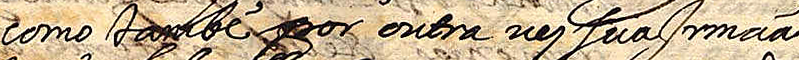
como tambē por outra uez sua Jrmaā
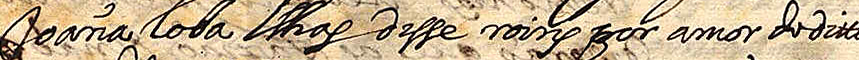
Joan̄a loba lhas disse roins por amor do ditto
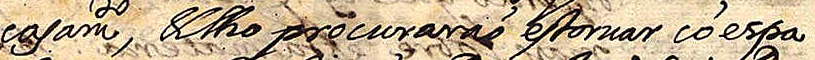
casamto, & lho procuraraõ estoruar cō espa
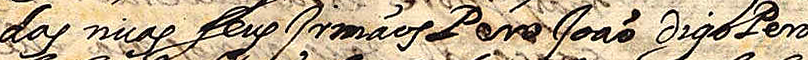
das nuas seus Jrmãos Pero Joaõ digo Pero
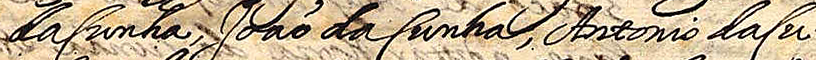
da Cunha, Joaõ da Cunha, Antonio da Cu
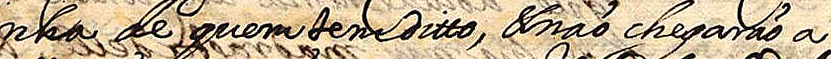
nha de quem tem ditto, & naõ chegaraõ a
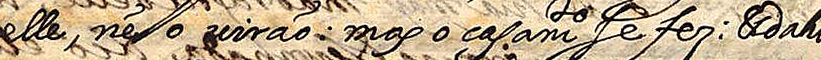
elle, nē o uiraõ : mas o casamto se fez : & dahi
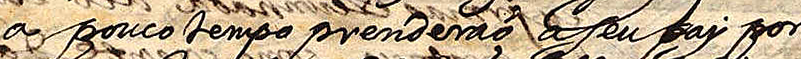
a pouco tempo prenderaõ a seu pay por
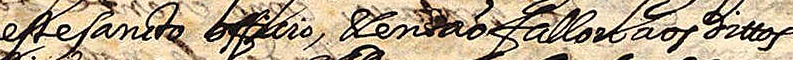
este sancto officio, & entaõ fallou aos dittos
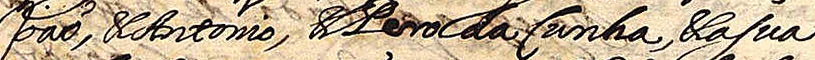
Joaõ, & Antonio, & Pero da Cunha, & a sua
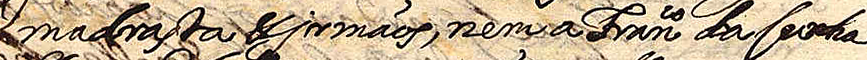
madrasta & jrmaõs, nem a Fraco da Cunha
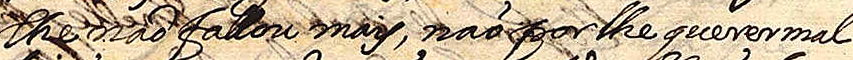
lhe naõ fallou mais, naõ por lhe querer mal
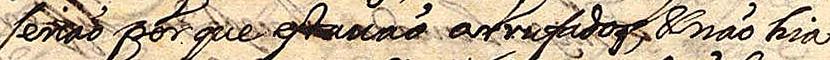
senaõ porque estauaõ arrufados, & naõ hia
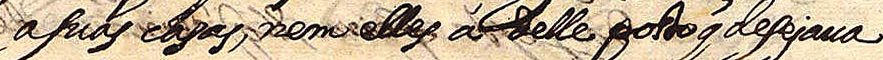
a suas casas, nem elles á delle posto q̄ desejaua
